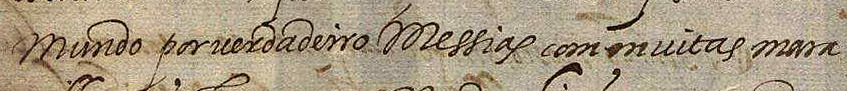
mundo por uerdadeiro Messias com muitas mara
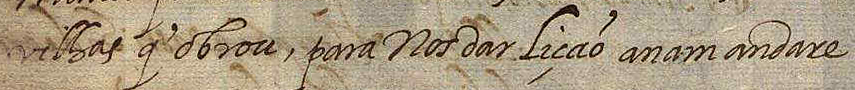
vilhas q̄ obrou, para nos dar liçaõ a nam andare
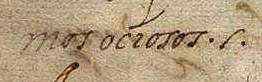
mos ociosos. /.
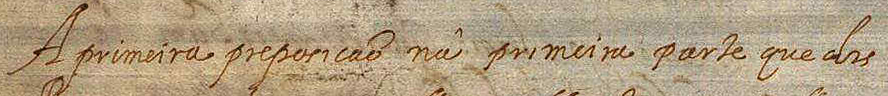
A primeira preposiçaõ na primeira parte que dis
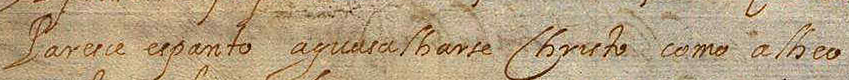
Parece espanto aguasalharse Christo como alheo
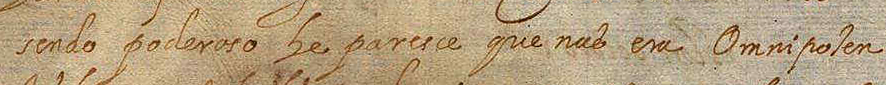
sendo poderoso he paresce que naõ era Omnipoten
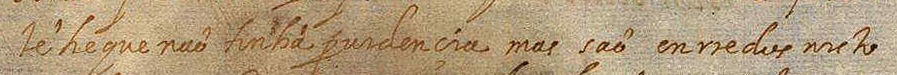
te he que naõ tinha ꝓuidencia mas saõ enrredos nisto
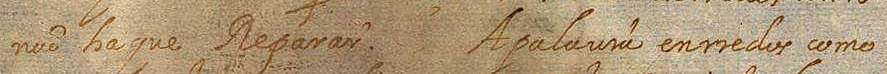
naõ ha que Reparar. A palaura enrredos como
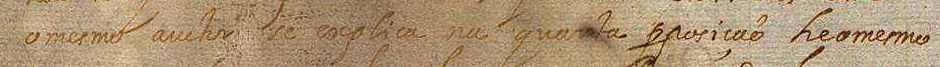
o mesmo auctor se explica na quarta ꝓposiçaõ he o mesmo
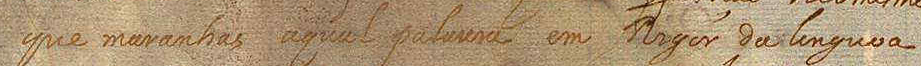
que maranhas a qual palaura em Rigor da linguoa
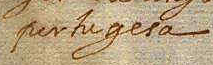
portugesa
